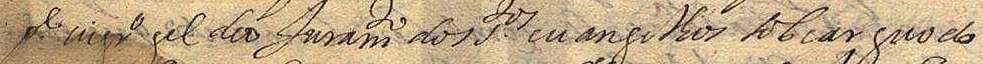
pe uigro gal deo Juramto dos stos euangelhos sob carguo do
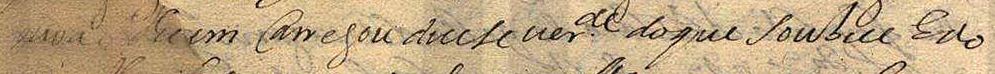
quoal lhe emCarregou dicese uer.de do que soubece E do
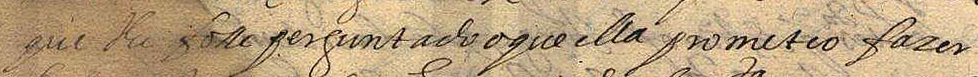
que lhe fosse perguntado o que ella prometeo fazer
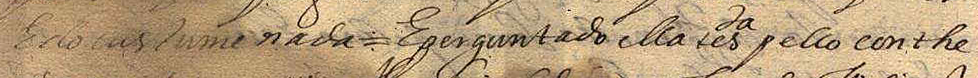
E do custume nada = E perguntado ella testa pello conthe
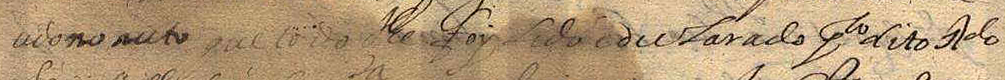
udo no auto que todo lhe foy lido e declarado p.lo dito Rdo
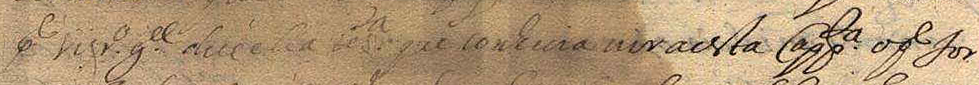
pe vigr.o g.al dice ella testa que conhecia uir a esta Capp.ta o pe Jor
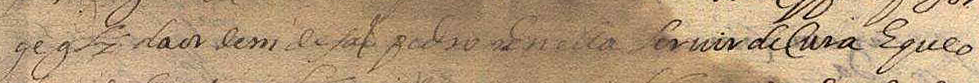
ge glz̄ da ordem de saõ pedro E nella seruir de Cura E que o
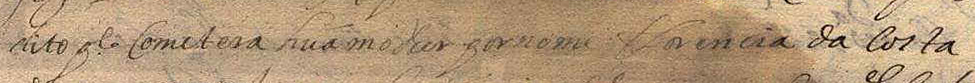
dito pe Cometera huā molher por nome florencia da Costa
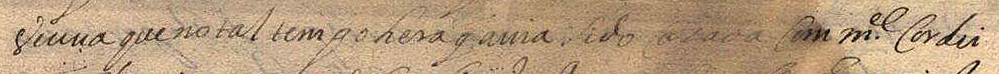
viuua que no tal tempo hera q̄ auia sido Cazada Com m.el Cordei
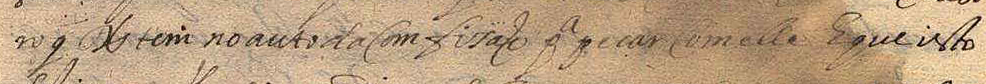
ro q̄ Ds̄ tem no auto da Comfisaõ pa pecar Com elle E que isto
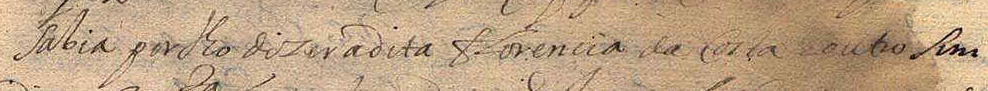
sabia por lho dizer a dita florencia da Costa outro sim
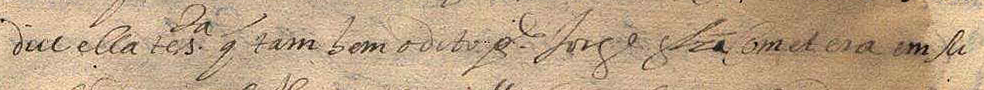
dice ella tes.ta q̄ tambem o dito p.e Jorge glz̄ Cometera em su
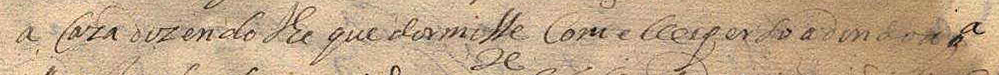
a Caza dizendo lhe que dormisse Com elles persoadindoa pa
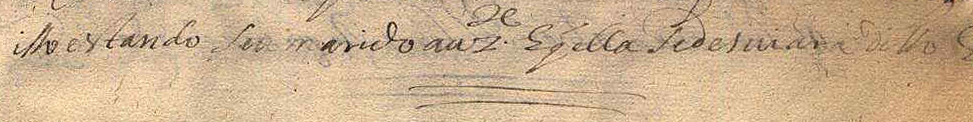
isso estando seu marido auz.te E q̄ ella se desuiara dello E
